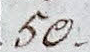50
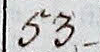53
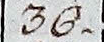36
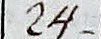24
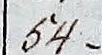54
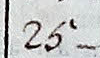25
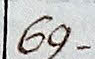69
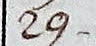29
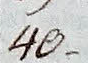40
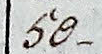50
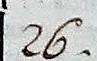26
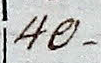40
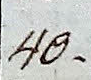40
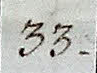33
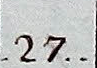27.
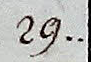29
